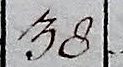38
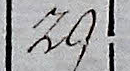29
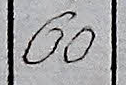60
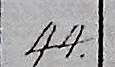44.
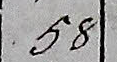58
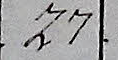27
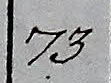73
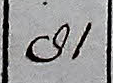81
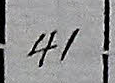41
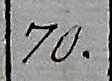70.
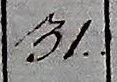31.
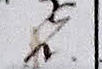2
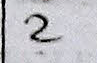2
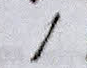1
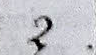2
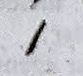1
